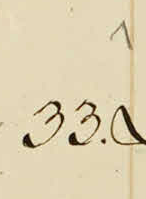33.
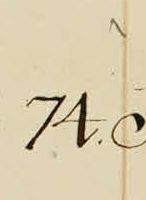74.
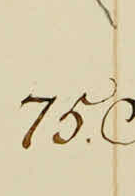75.
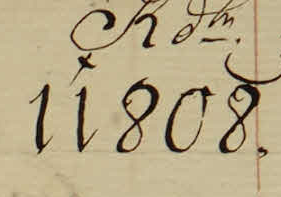11808
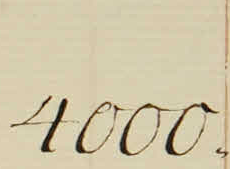4000
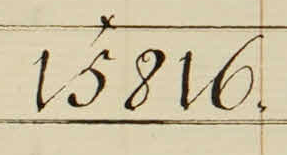15816
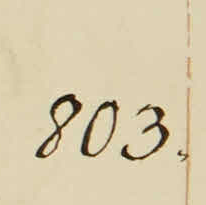803
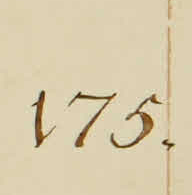175
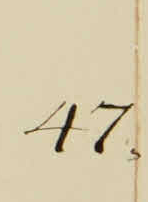47
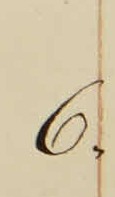6
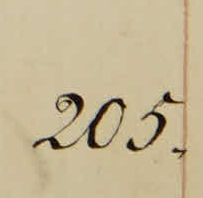205
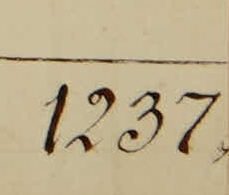1237
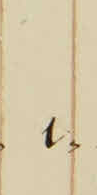1
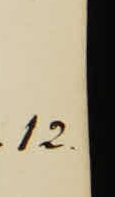12.
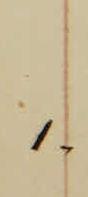1
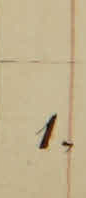1
